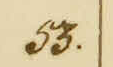53.
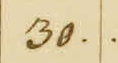30.
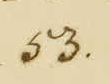53.
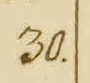30.
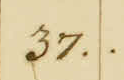37.
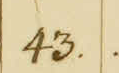43.
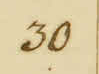30
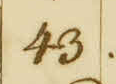43
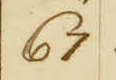67
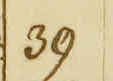39
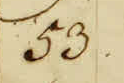53
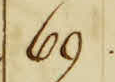69
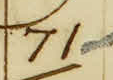71
